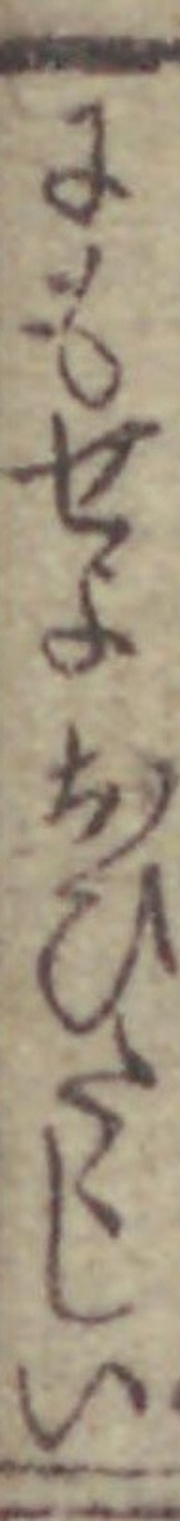にもせよおびたゝしい
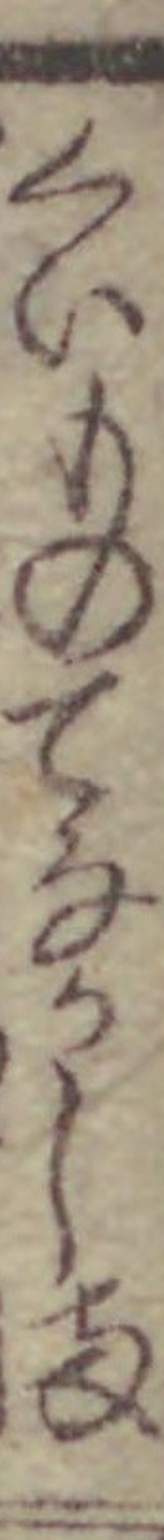くいものてなかしま
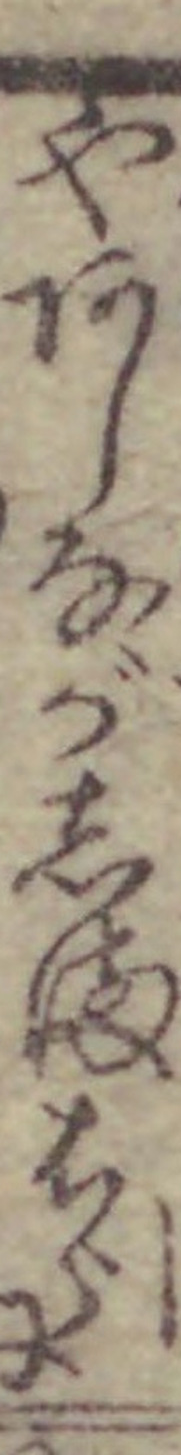やあしながしまはらに
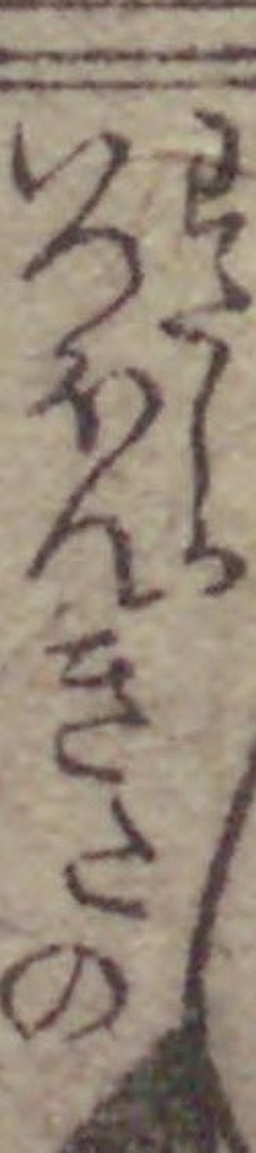いつほんきたの
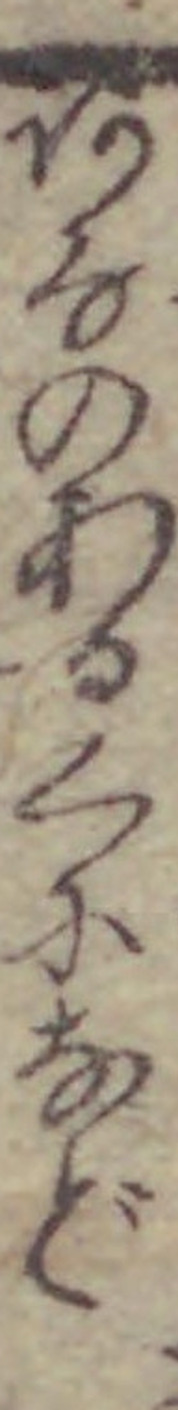あなのあるくになど
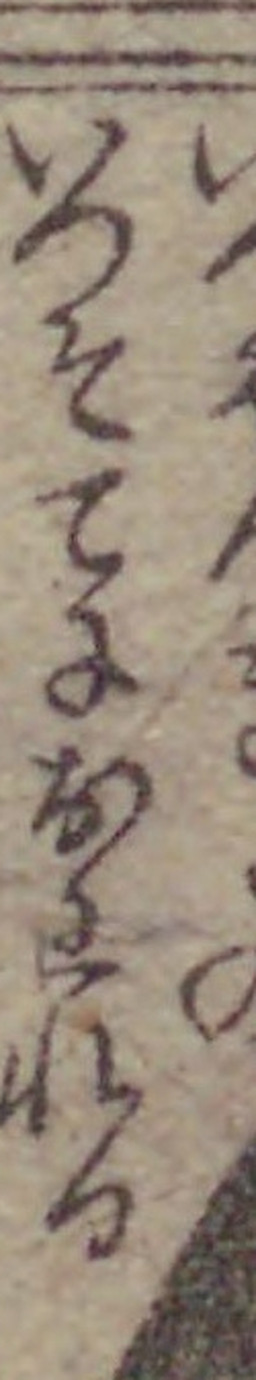いつそてにおわれる
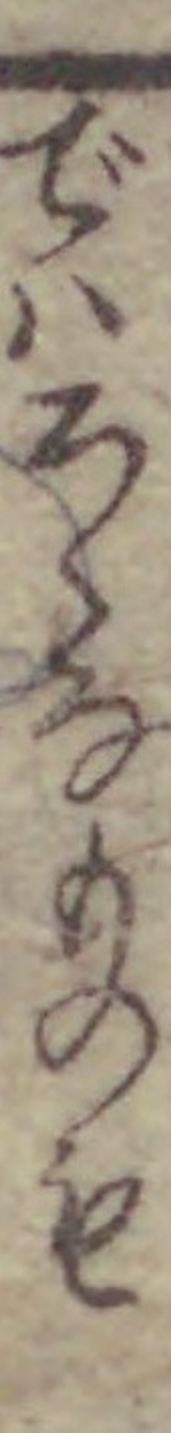ではろくなものも
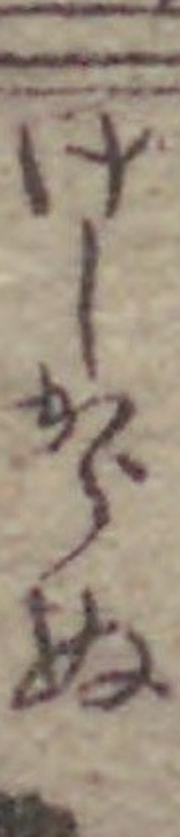けしからぬ
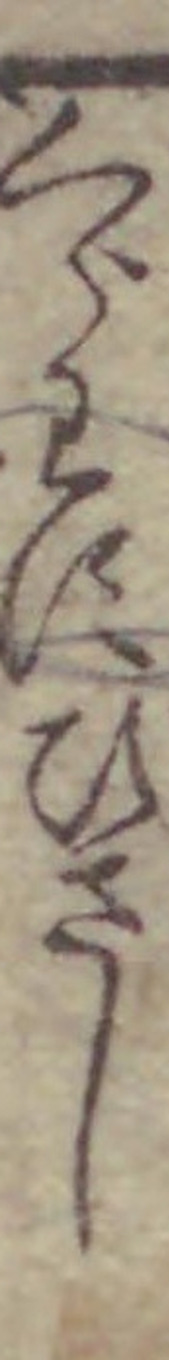くらわすひさし
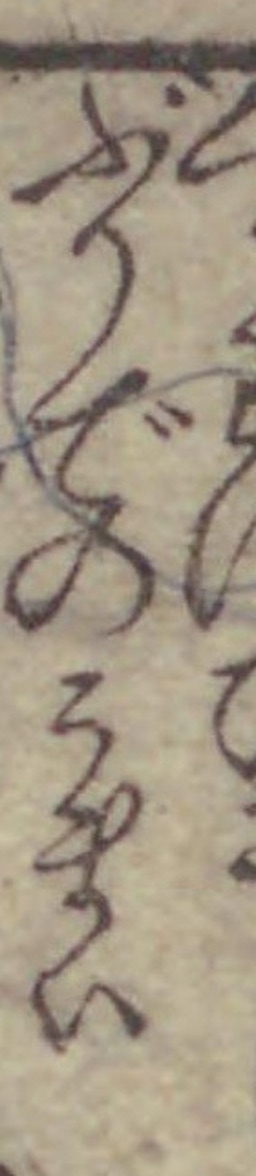ぶりでのうまい
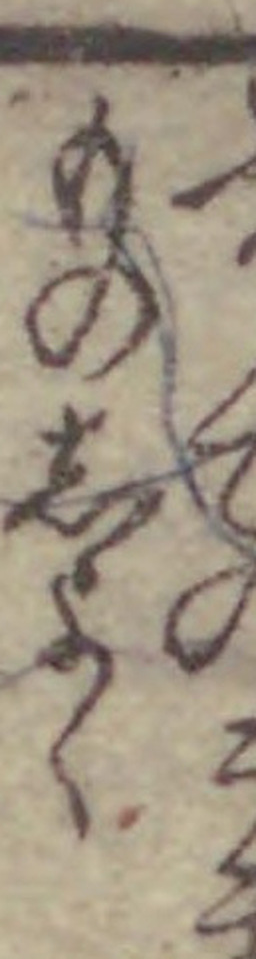ものしよく
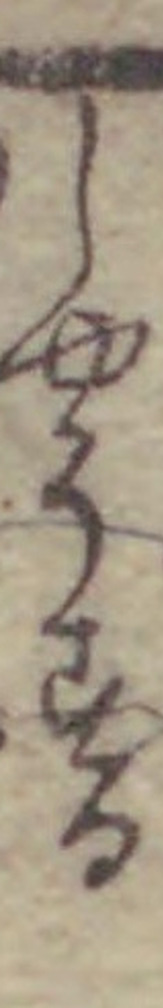しやうする
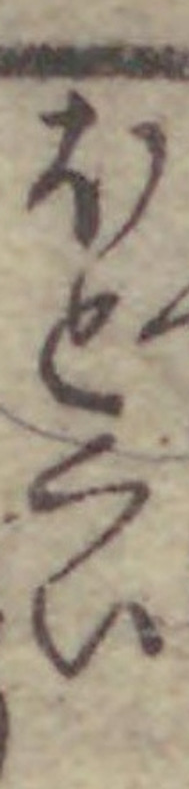ほとくい

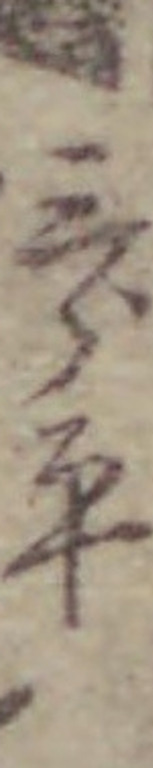三郎平
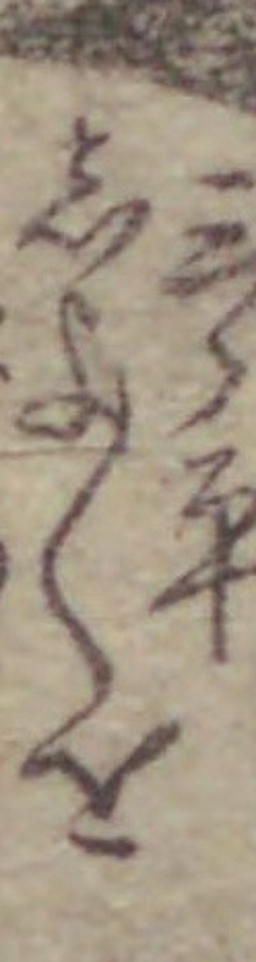しよ〳〵を
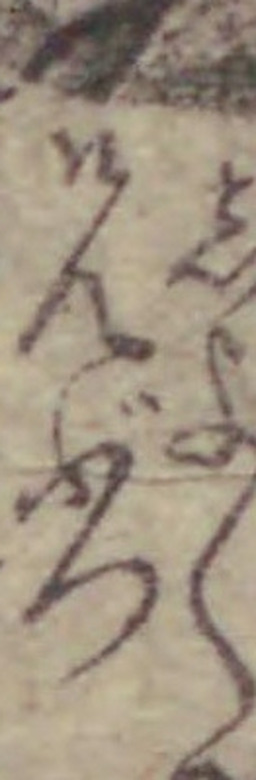けんぶつ
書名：近頃嶋めぐり 3巻
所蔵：国立国会図書館 National Diet Library, JAPAN
